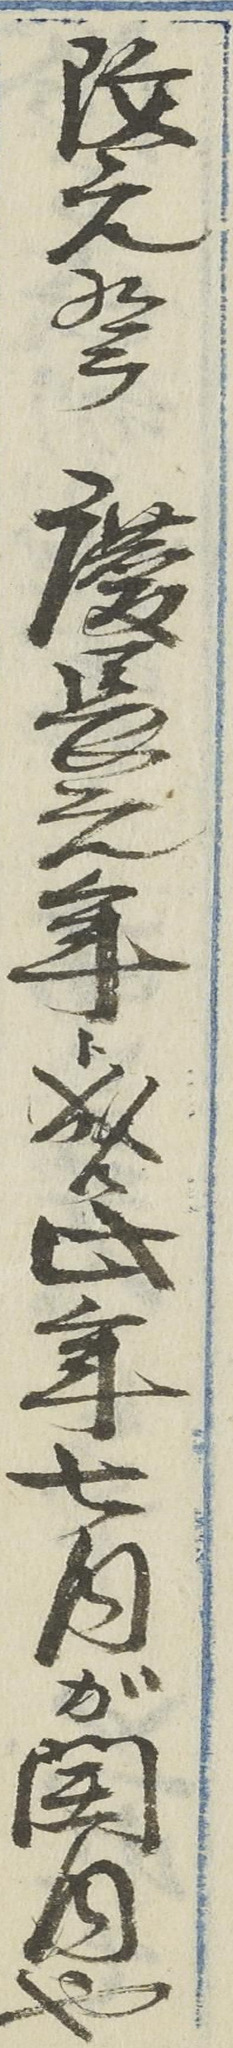改元有テ慶長元年ト成ル此年七月ガ閏月也
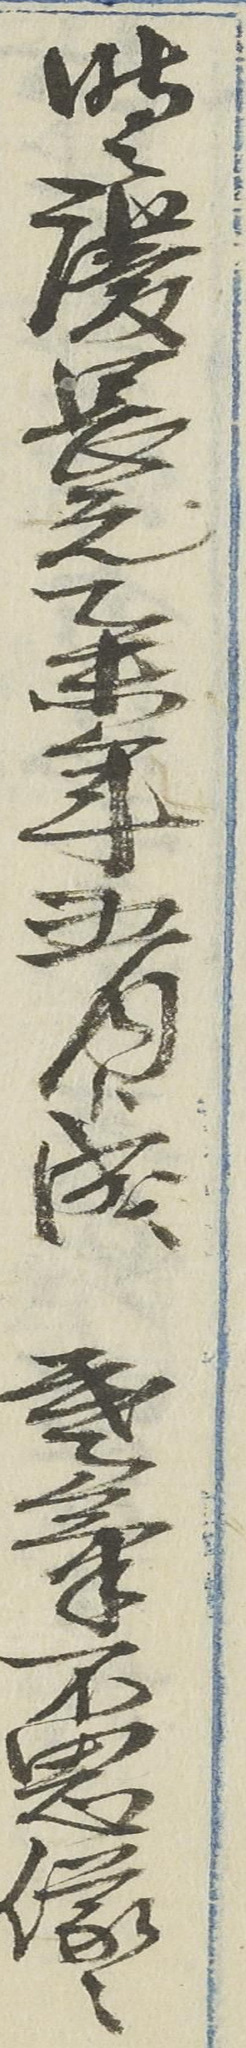時ニ慶長元乙未年五月ト成寒氣不思儀ニ
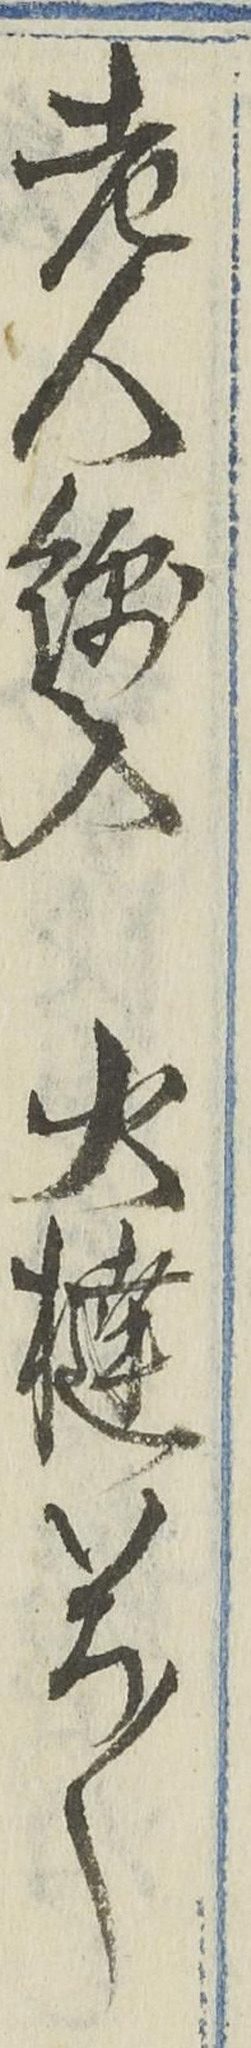老人綿入火燵いろ〳〵
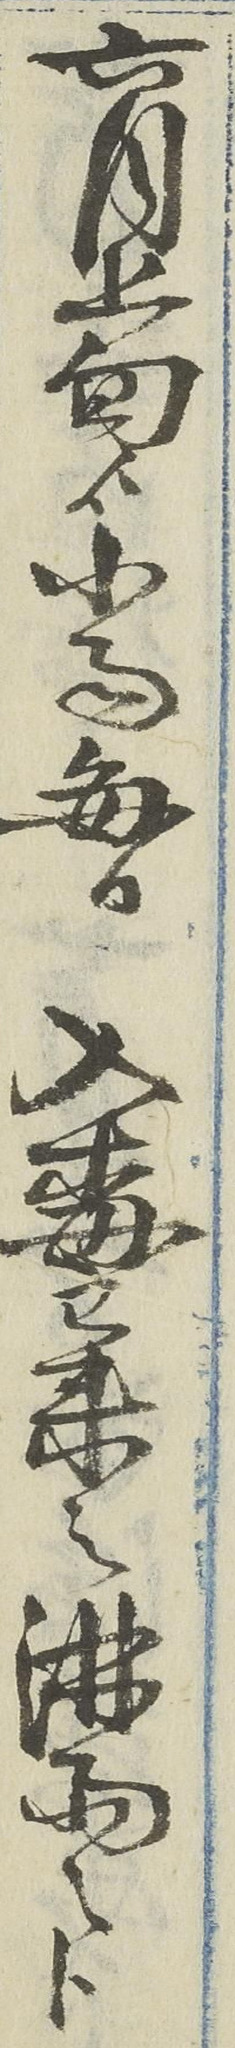六月上旬ゟ小雨毎日入梅已来之淋雨之ト

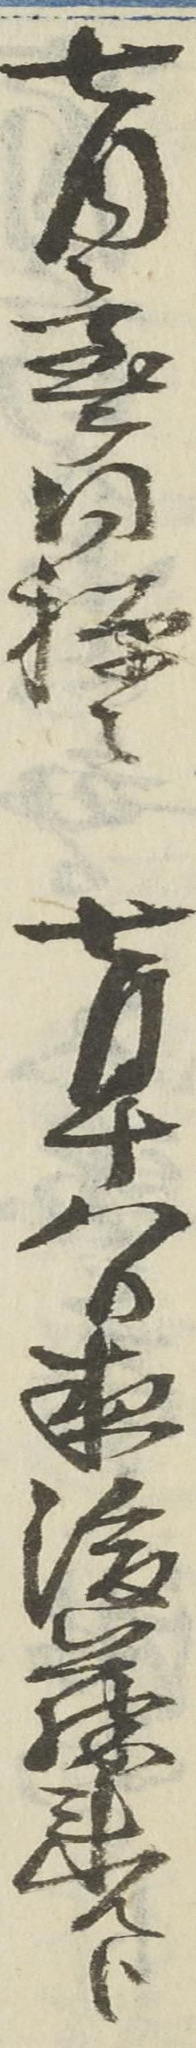七月ニ至テ同様ニ七月十八日夜後藤来ルト
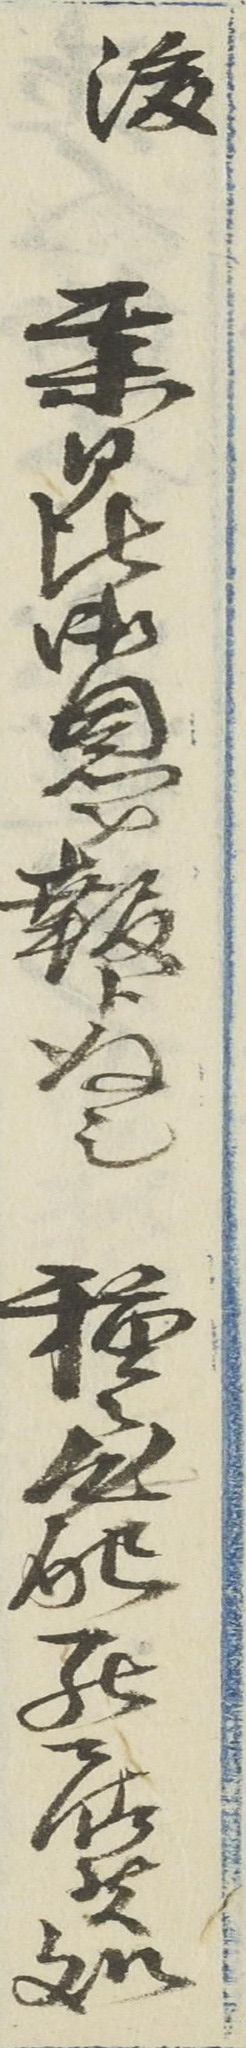後某日比御恩ヲ報ト存シ種〻心配罷居候処
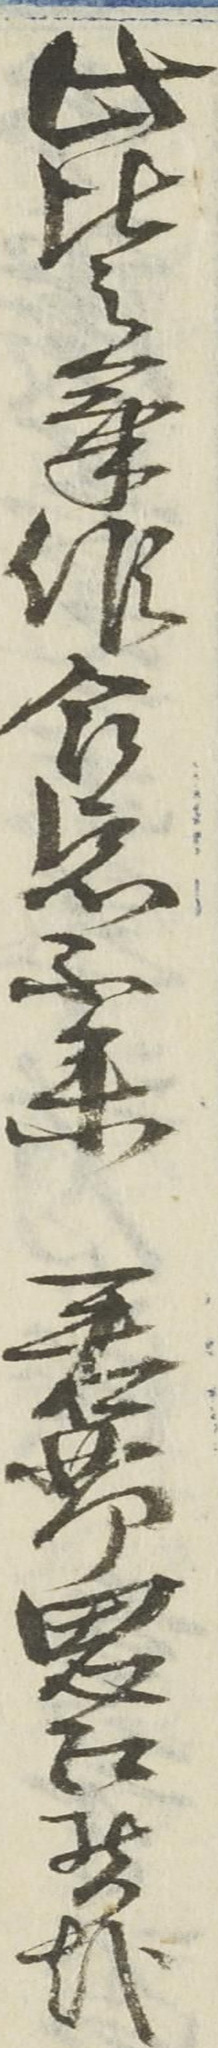此比之氣候合点不参君如何思召候哉
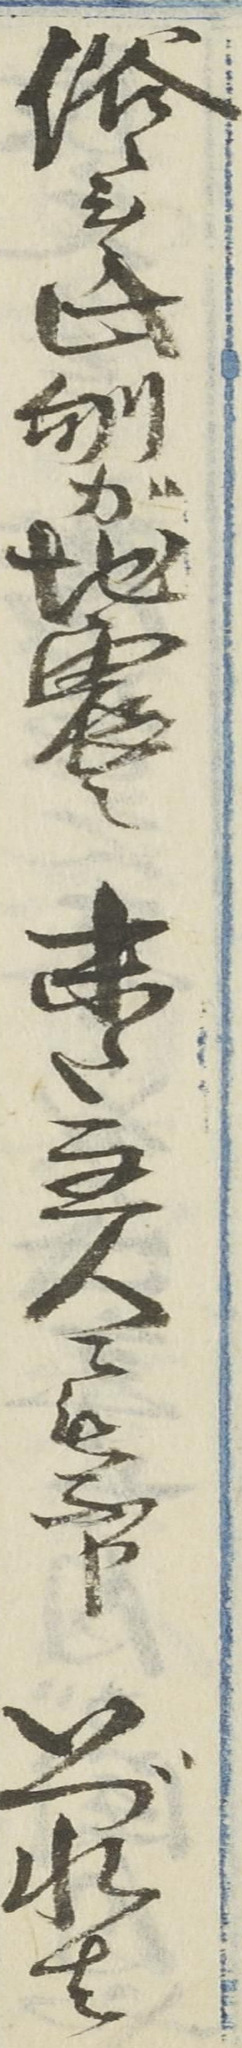俗ニ言ウ此刎ガ地震之未た主人ニモ不申いづれハ
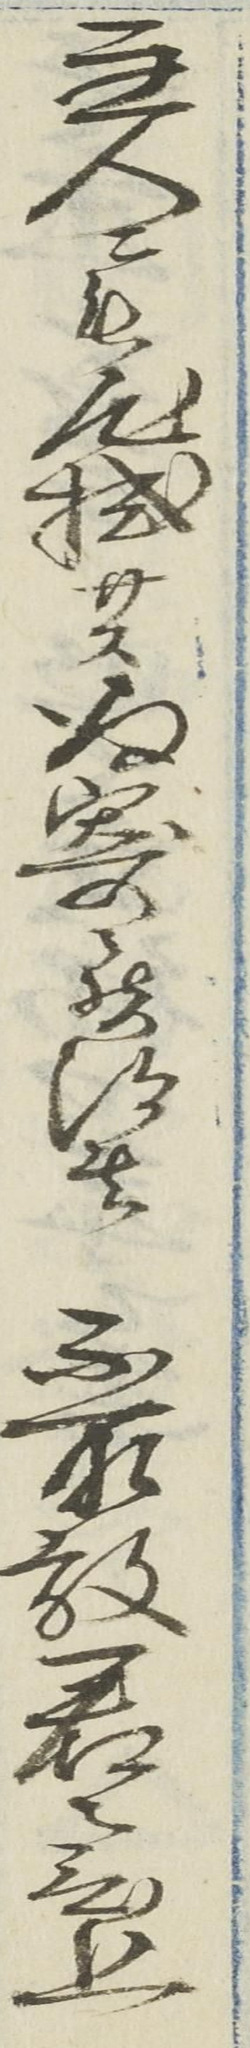主人ニモ心掛サス存寄ニ候得共不取敢君二云上
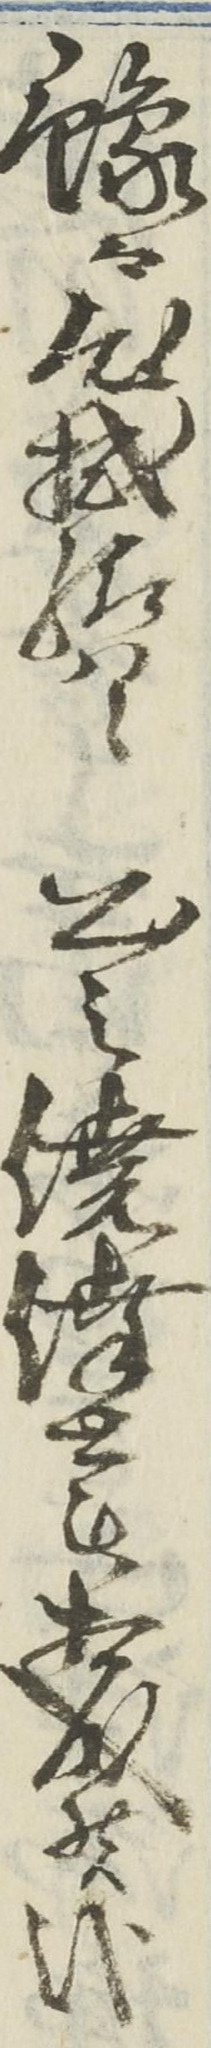豫々心掛給ハし公之僥倖二モ相成候哉
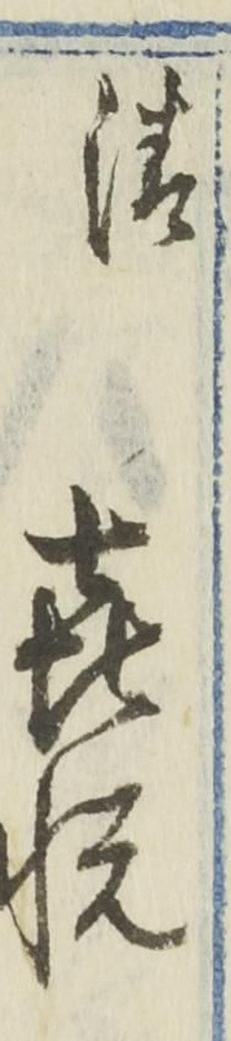清喜悦
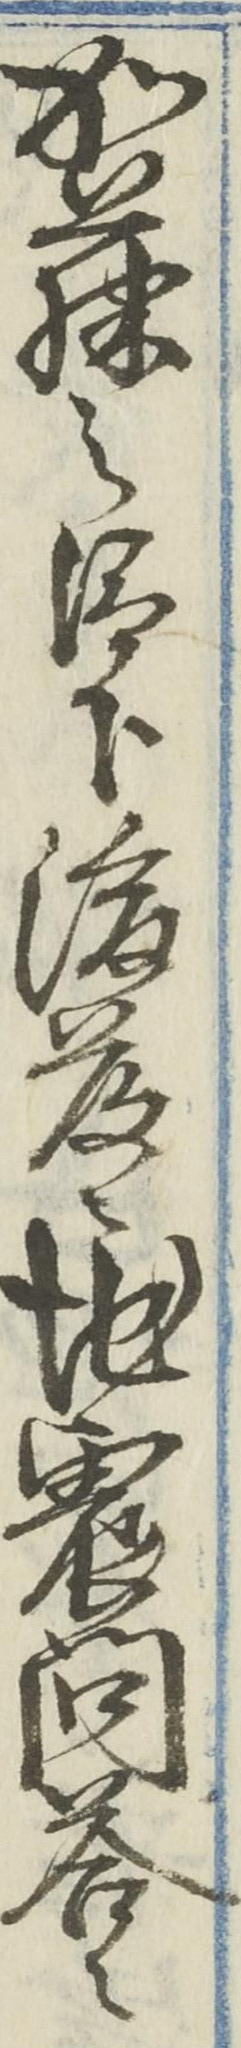加藤之臣下後藤ニ地震問答之
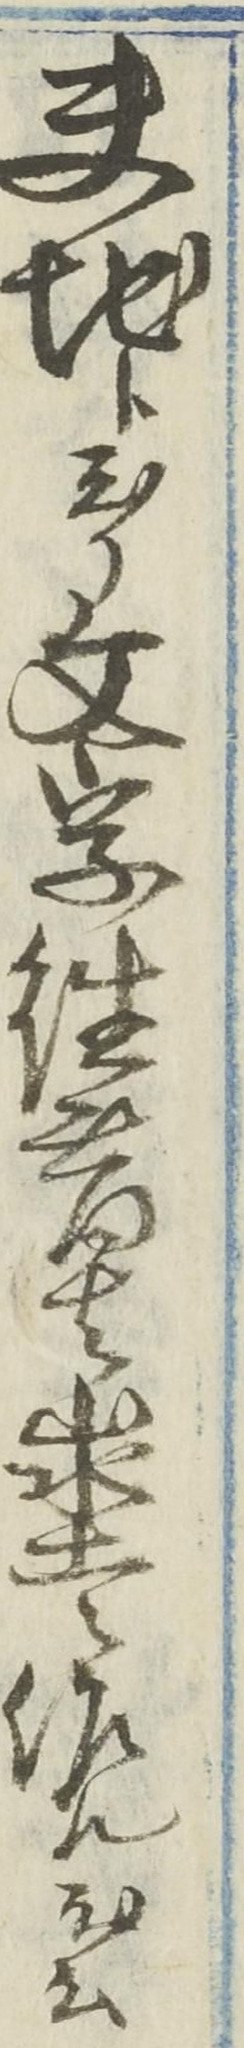夫地ト云ウ文字往昔ハ崩土ニ候ん云云
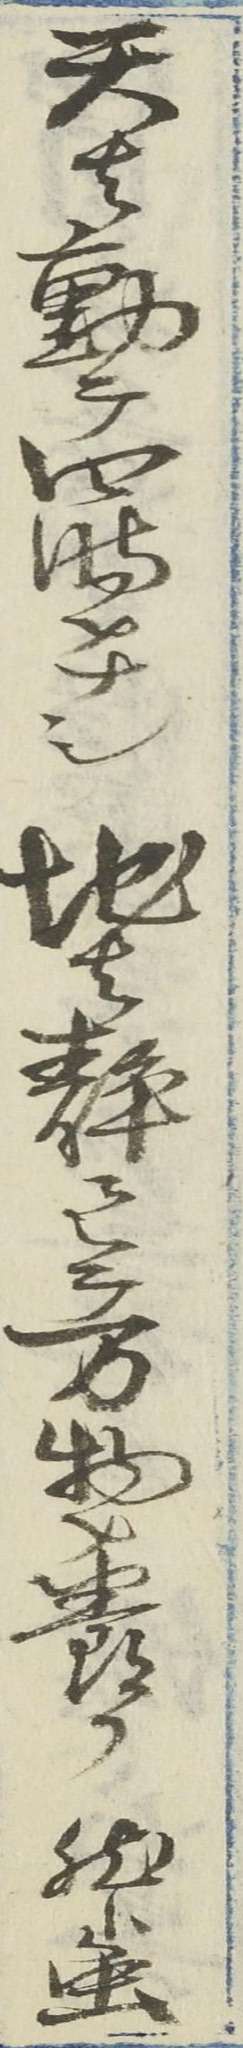天ハ動テ四時ヲナシ地ハ静ニシテ万物ヲ養ウ然ト雖
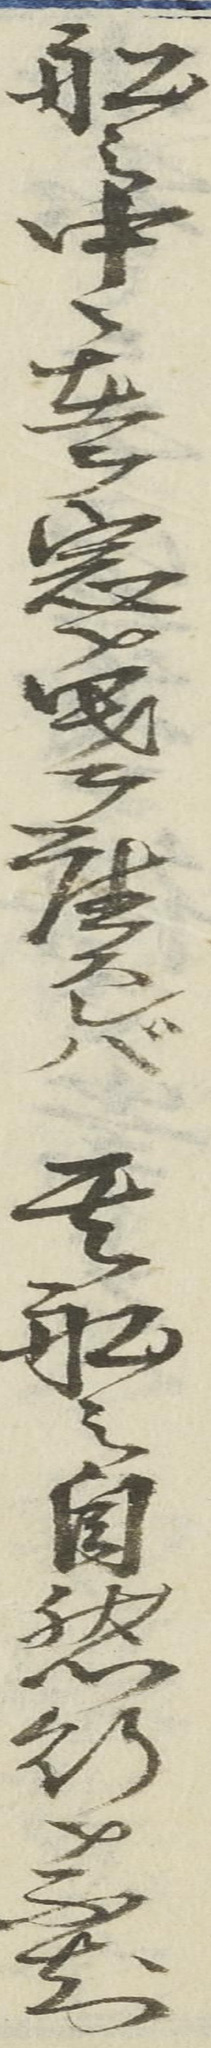船之中ニ在テ窓ヲ曳テ座スレバ其船之自然行ヲ不知
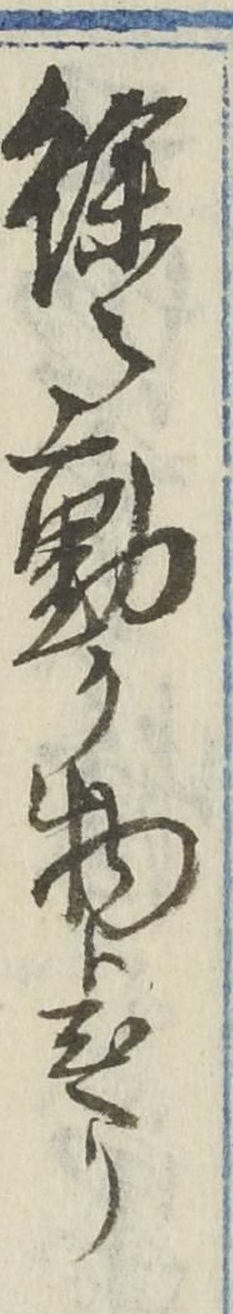徐ニ動ク物ト云ヘリ
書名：伏水大地震
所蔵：東京大学地震研究所図書室 Earthquake Research Institute Library, The University of Tokyo, JAPAN
